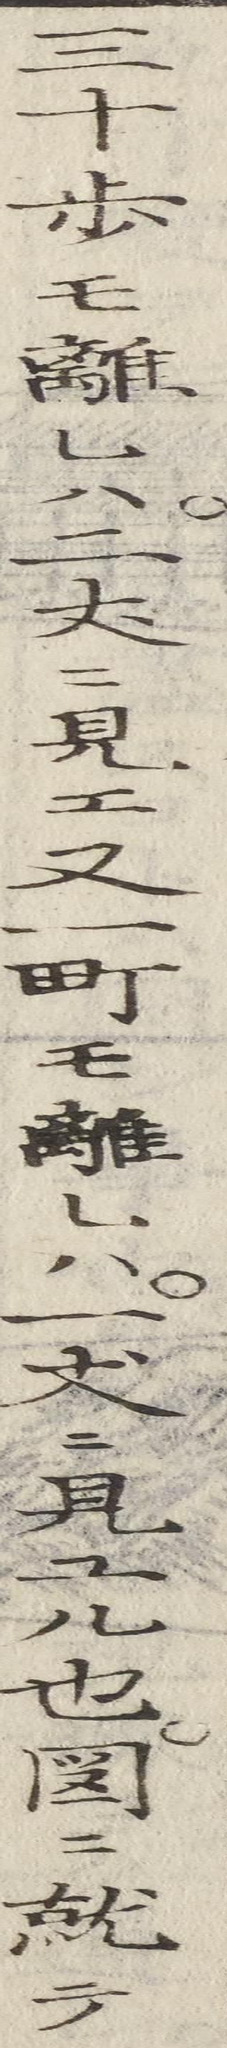三十歩モ離レハ。二丈ニ見エ又一町モ離レハ。一丈ニ見ユル也。図ニ就テ
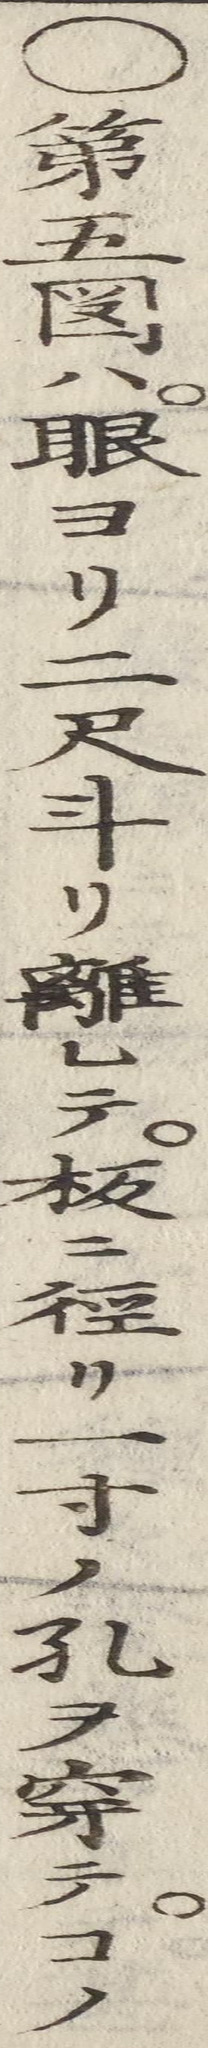○第五図ハ。眼ヨリ二尺斗リ離レテ。板ニ径リ一寸ノ孔ヲ穿テ。コノ
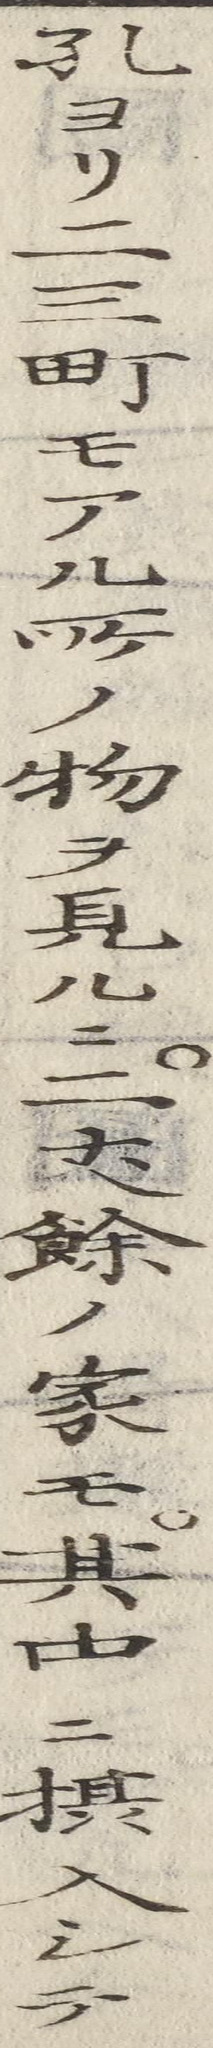孔ヨリ二三町モアル所ノ物ヲ見ルニ。二丈余ノ家モ。其中ニ摂入シテ
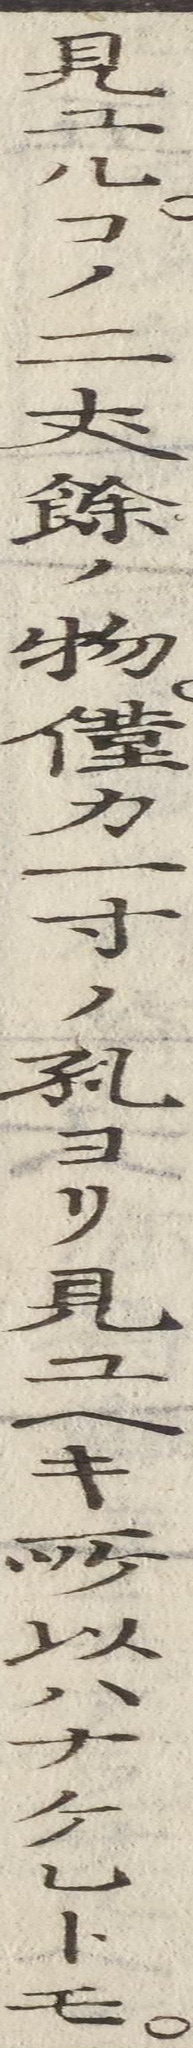見ユル。コノ二丈余ノ物。僅カ一寸ノ孔ヨリ見ユヘキ所以ハナケレトモ。
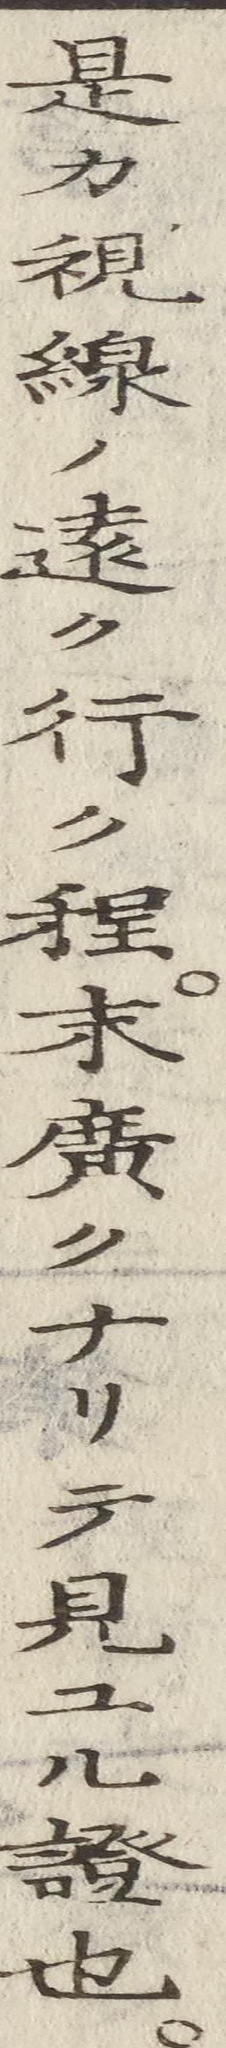是カ視線ノ遠ク行ク程。末広クナリテ見ユル証也。
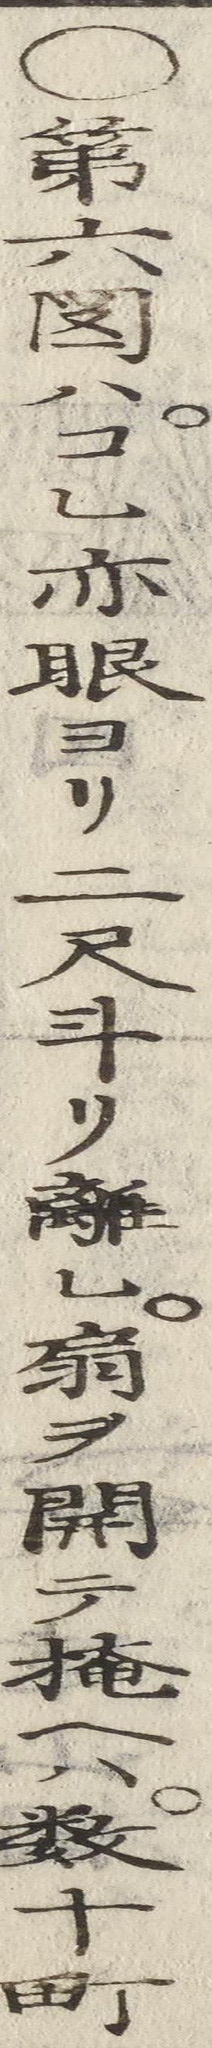○第六図ハ。コレ亦眼ヨリ二尺斗リ離レ。扇ヲ開テ掩ヘハ。数十町
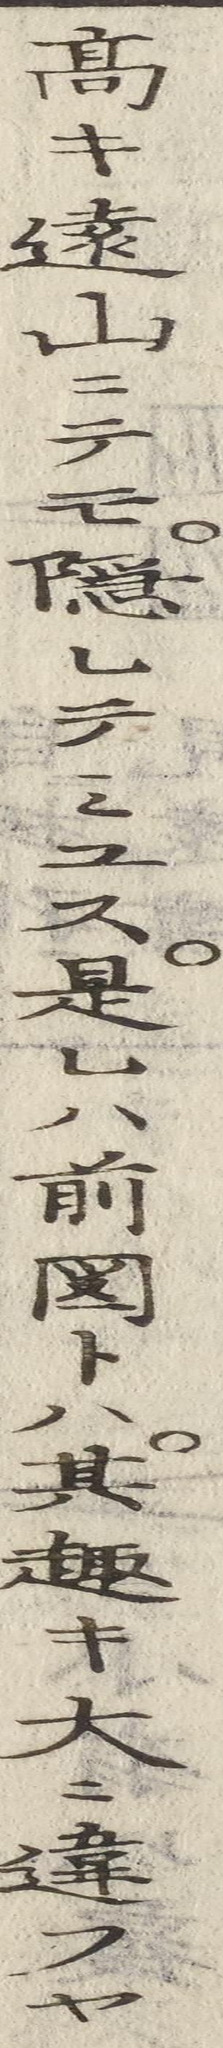髙キ遠山ニテモ。隠レテミユス。是レハ前図トハ。其趣キ大ニ違フヤ
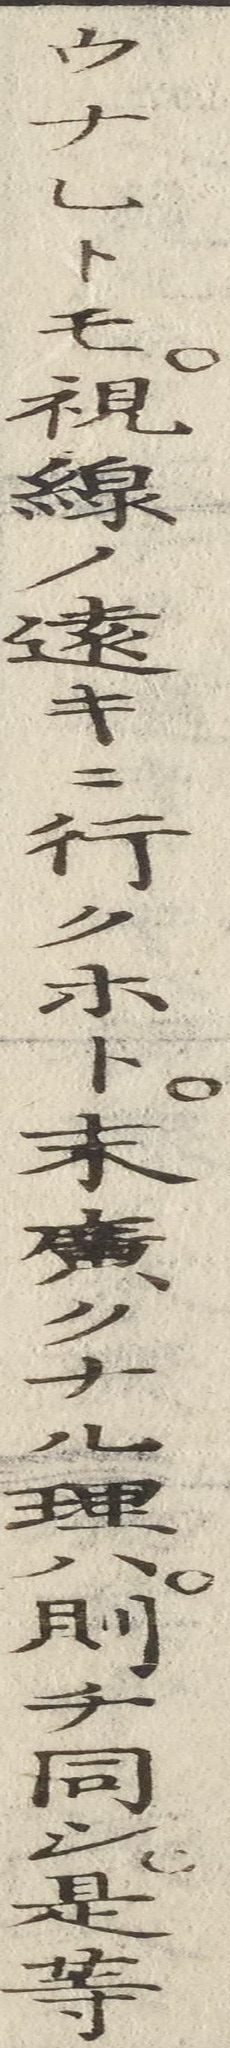ウナレトモ。視線ノ遠キニ行クホト。末広クナル理ハ。則チ同シ。是等
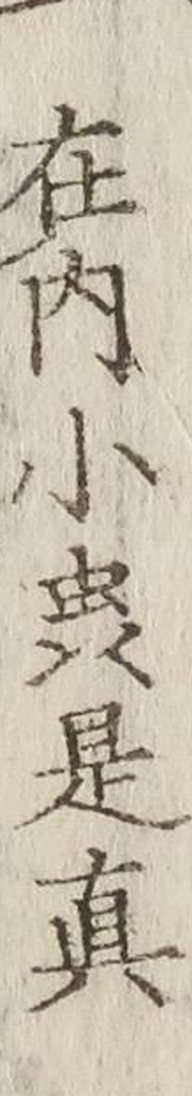在内小蟲是真
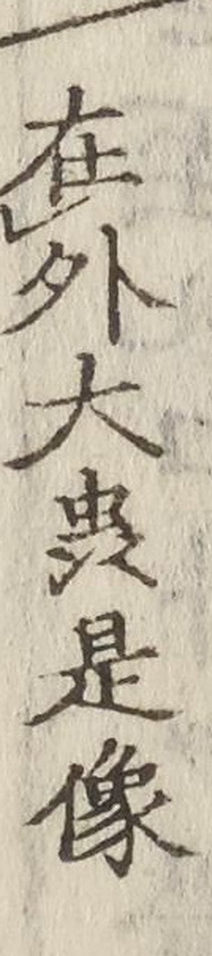在外大蟲是像

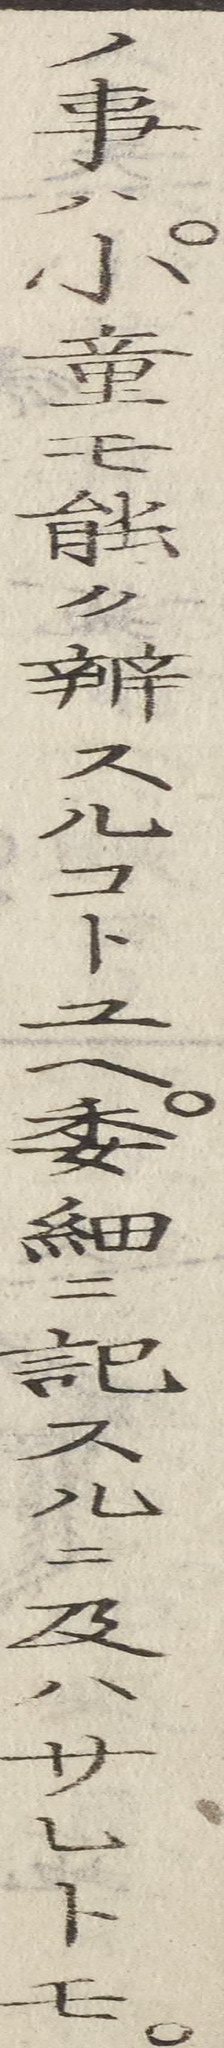ノ事ハ。小童モ能ク弁スルコトユヘ。委細ニ記スルニ及ハサレトモ。
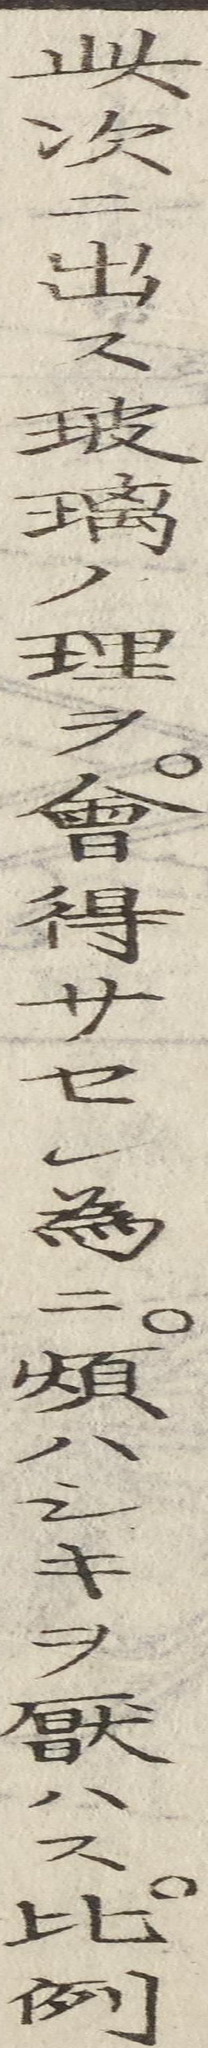此次ニ出ス玻璃ノ理ヲ。会得サセシ為ニ。煩ハシキヲ厭ハス。比例
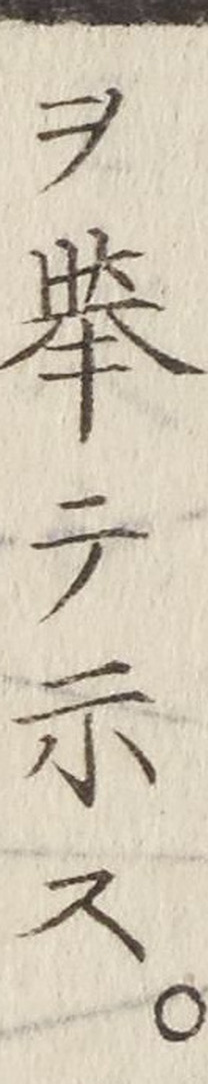ヲ挙テ示ス。
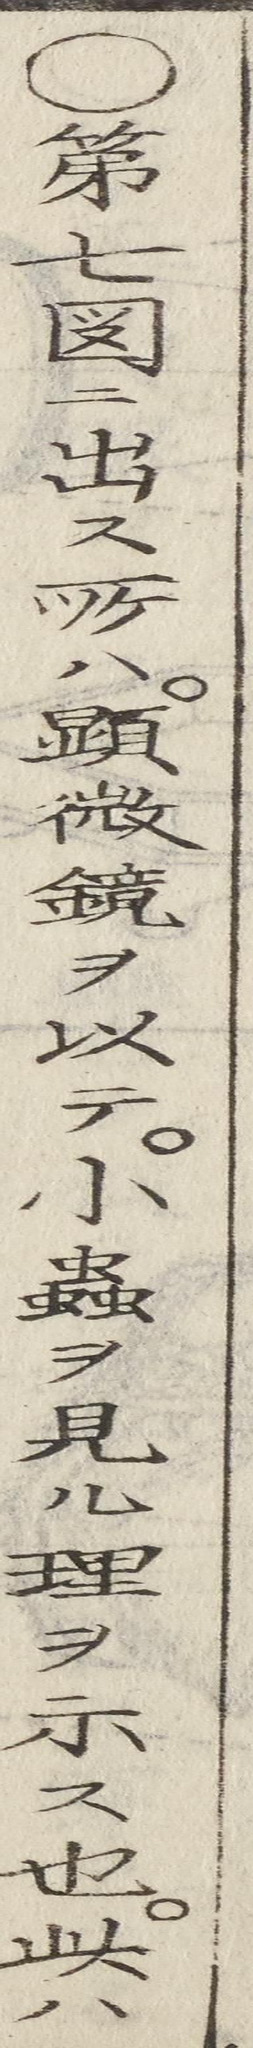○第七図ニ出ス所ハ。顕微鏡ヲ以テ。小蟲ヲ見ル理ヲ示ス也。此ハ
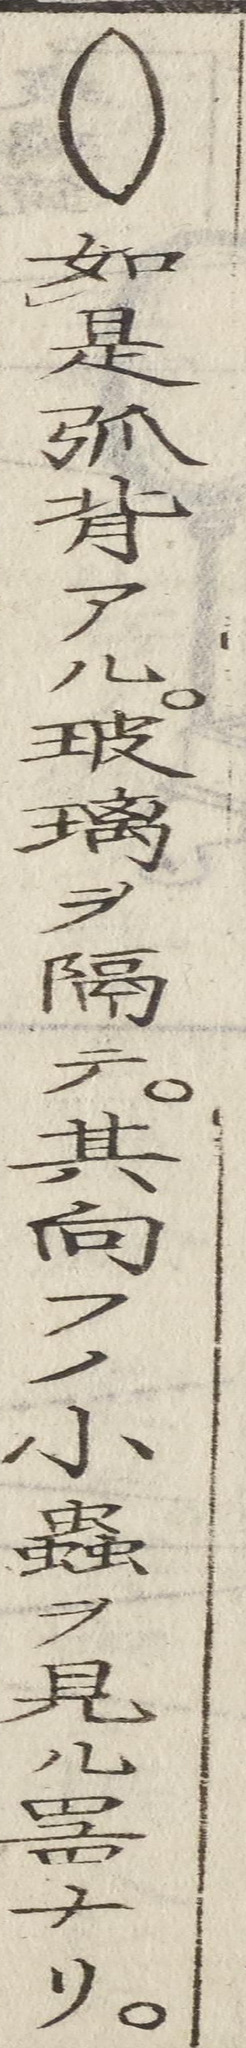如是弧背アル。玻璃ヲ隔テ。其向フノ小蟲ヲ見ル器ナリ。
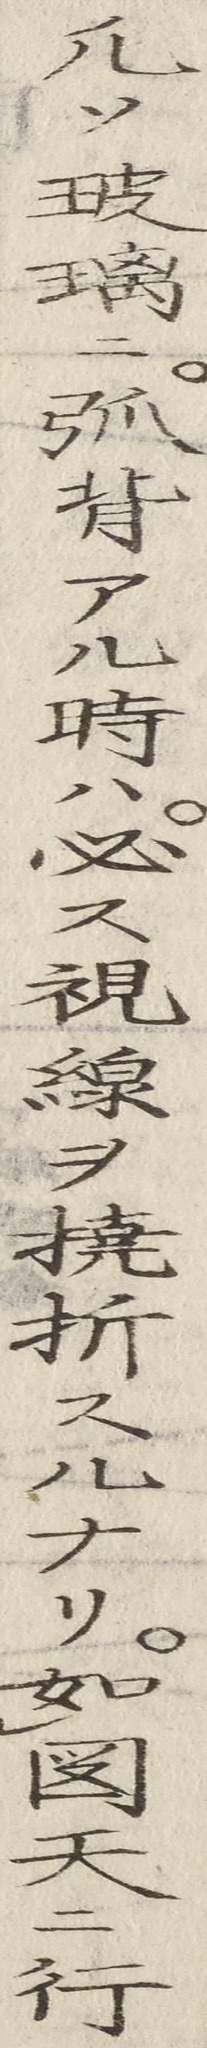凡ソ玻璃ニ。弧背アル時ハ。必ス視線ヲ撓折スルナリ。如図天ニ行
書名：護法新論　上
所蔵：東京大学地震研究所図書室 Earthquake Research Institute Library, The University of Tokyo, JAPAN
